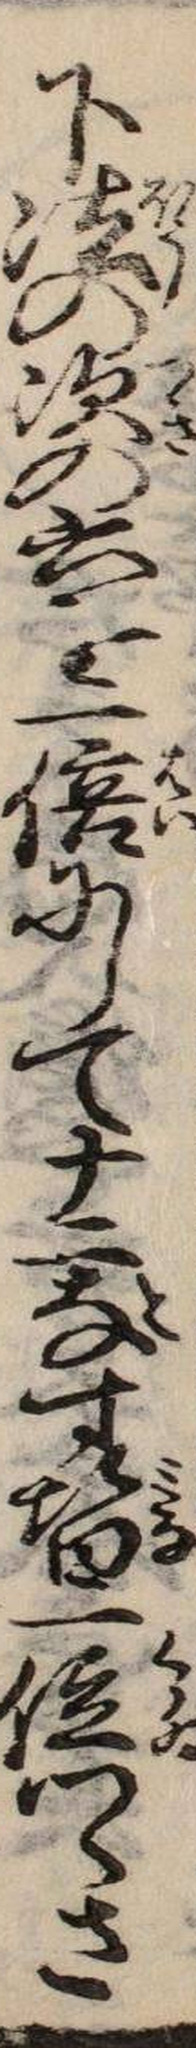下法の次の六を一倍にして十二となす皆一位つつさ
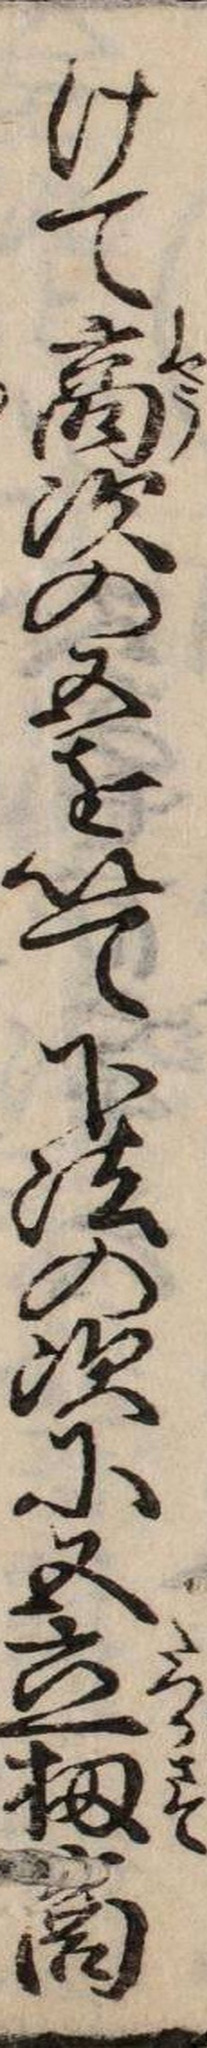けて商の次の五を以て下法の次に又立扨商
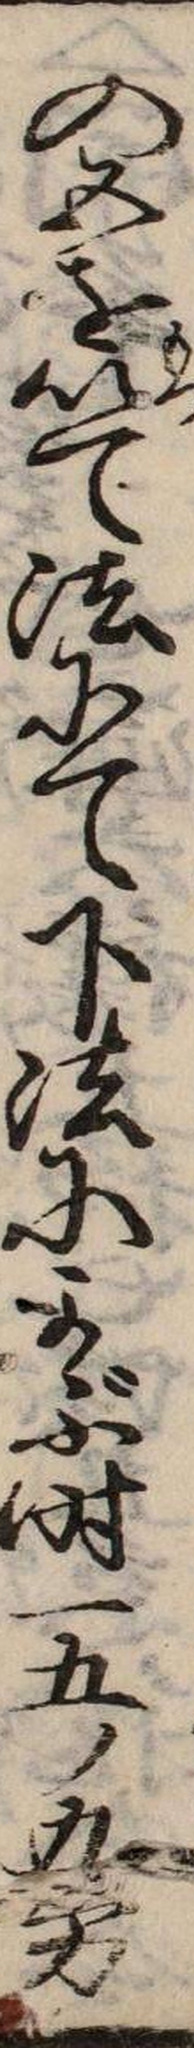の五を以て法にて下法によぶ時一五の五万
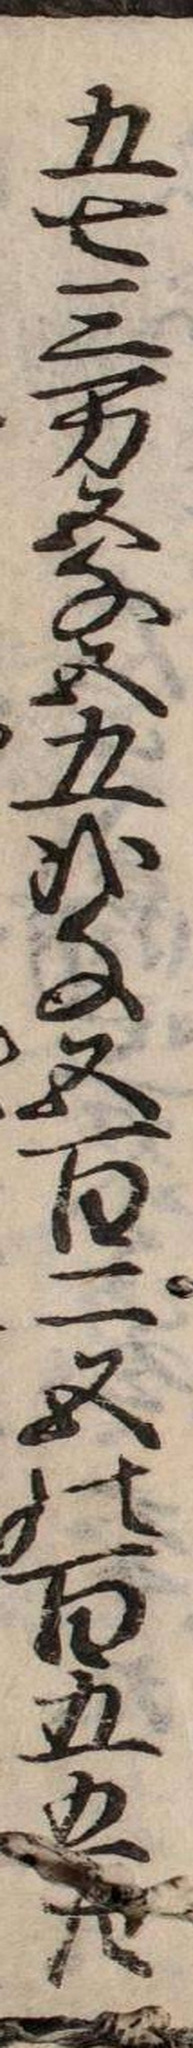五七三万五千五五弐千五百二五の百五五廿
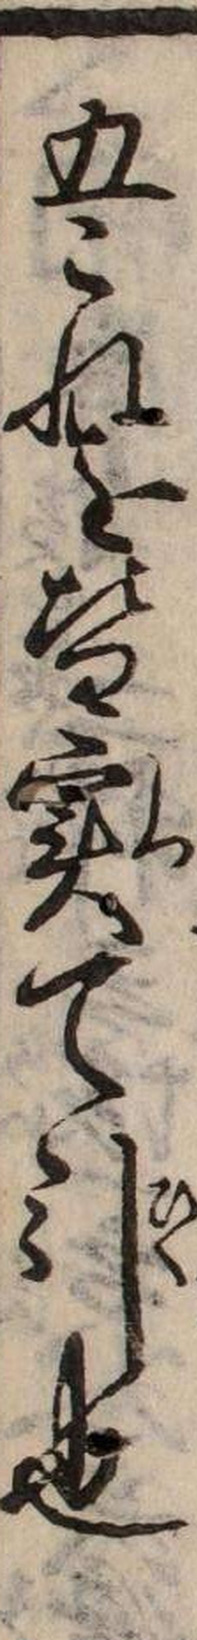五これを皆実て引也

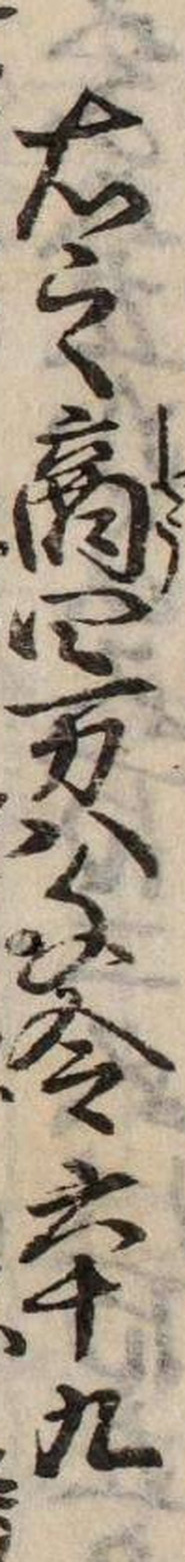右之商四万八千令六十九
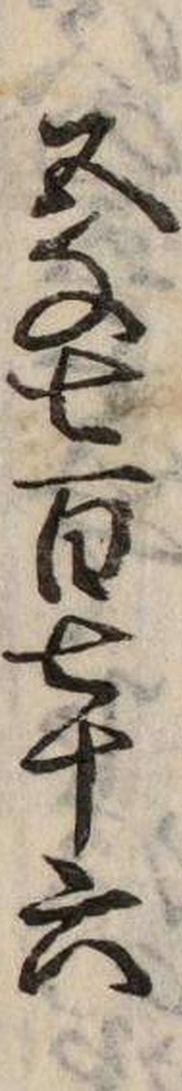五千七百七十六
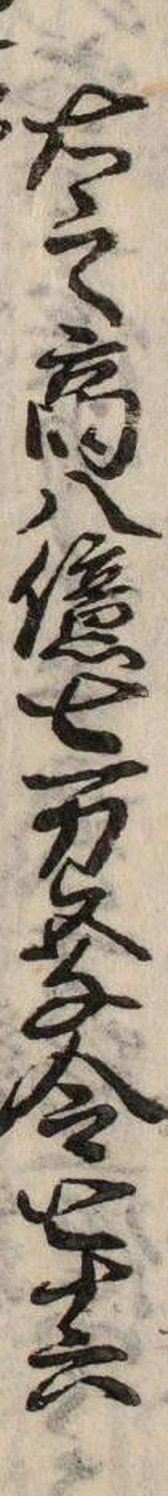右之商八億七万五千令七十六
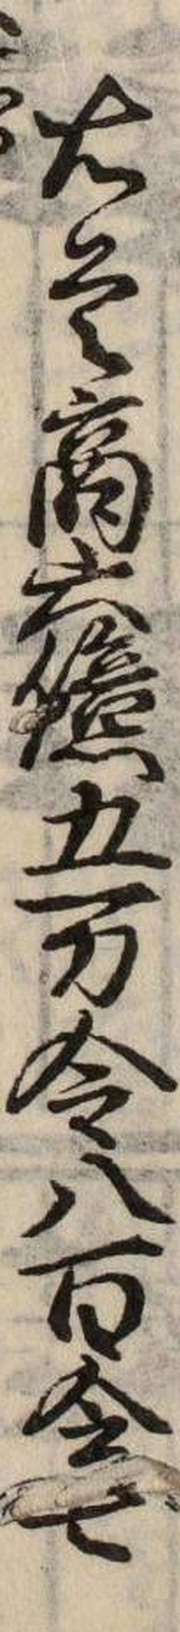右之商六億五万令八百令七
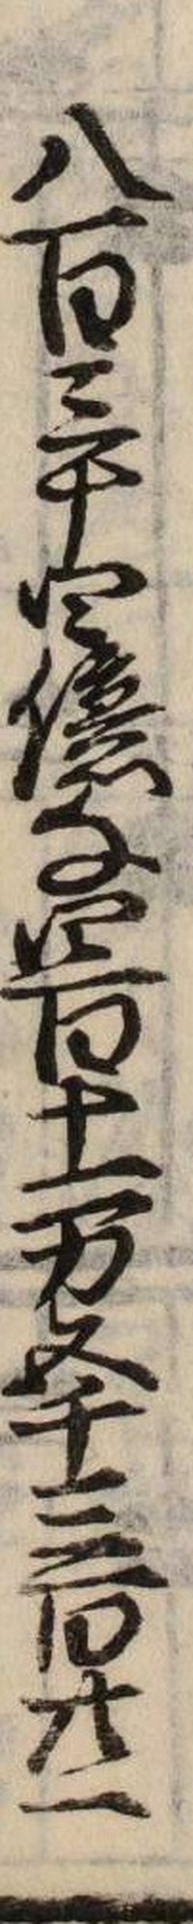八百三千四億千四百十一万五千三百廿一
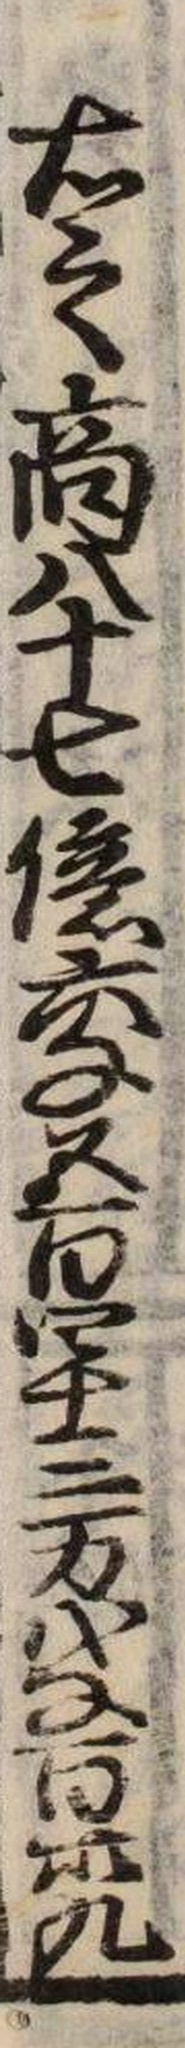右之商八十七億六千五百四千三万弐千百卅九
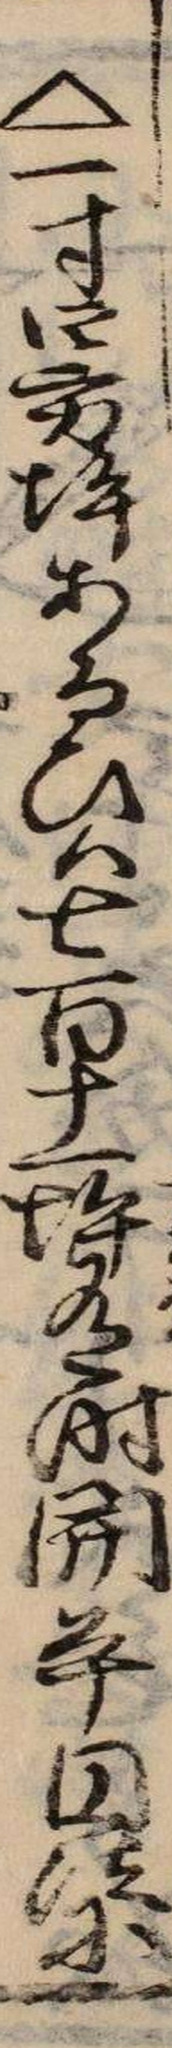△一寸四方坪あるひは七百十一坪有時開平円法に
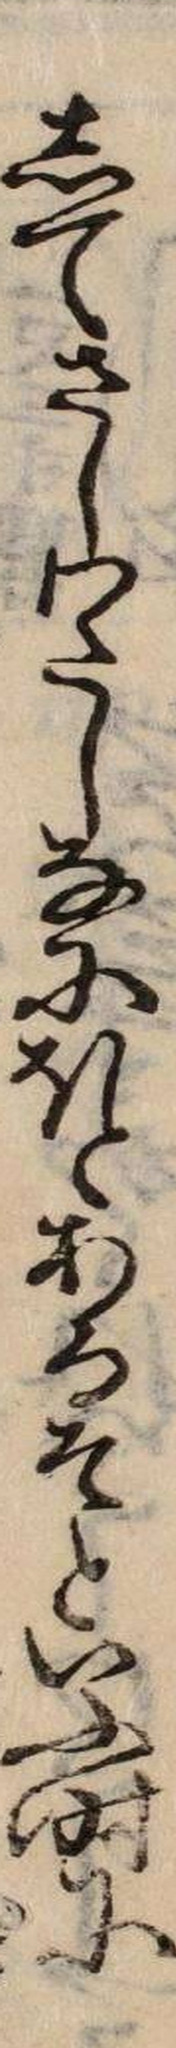してさしわたしなにほとあるそといふ時に
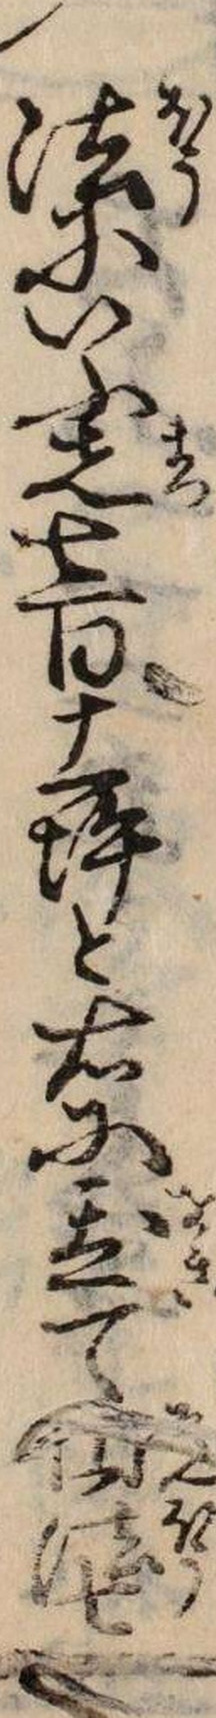法にいふ先七百十一坪と右に置て円法七
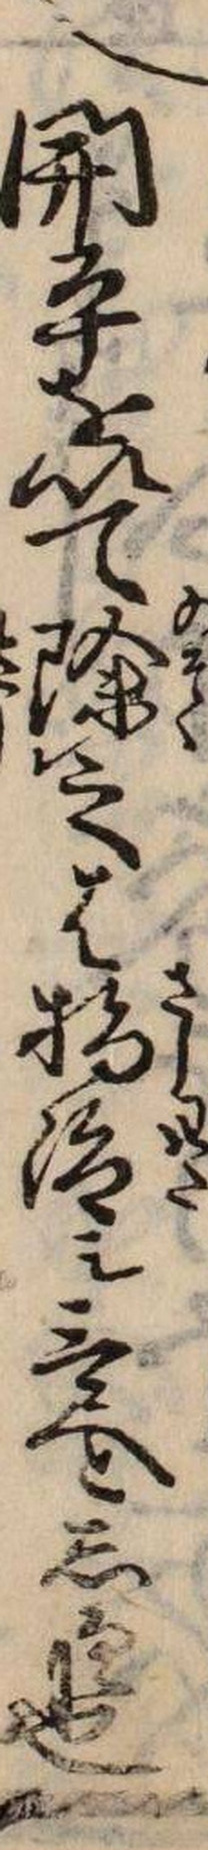開平を以て除之は指渡し三尺としる也
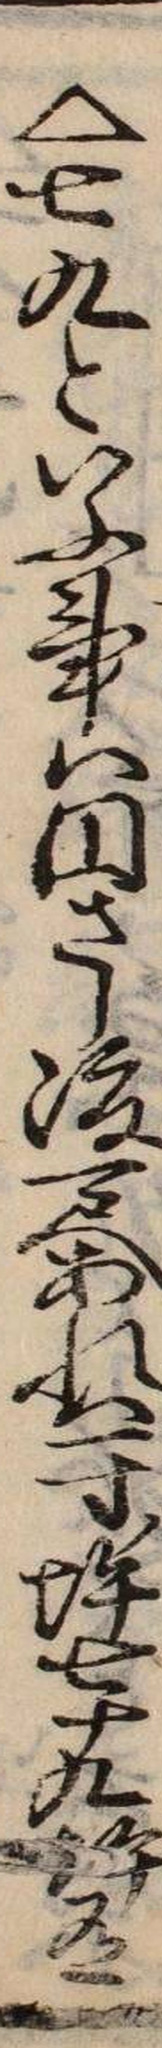△七九といふ事は円さし渡一尺あれは一寸の坪七十九坪有
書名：塵劫記（寛永11年自跋、京都府立京都学・歴彩館追貴8）
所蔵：京都府立京都学・歴彩館 国文学研究資料館
